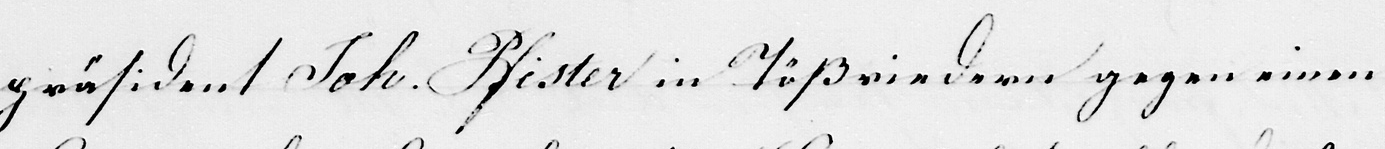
präsident Joh. Pfister in Tößriedern gegen einen
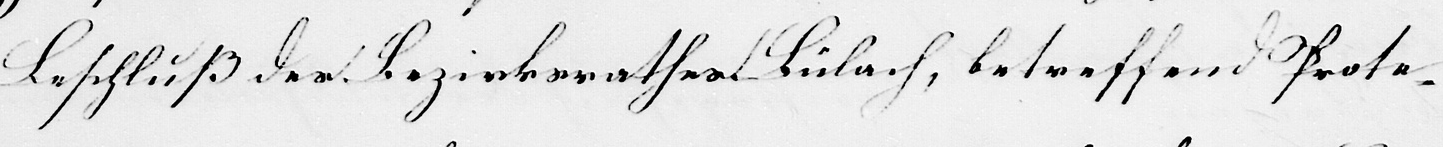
Beschluß des Bezirksrathes Bülach, betreffend Prote¬
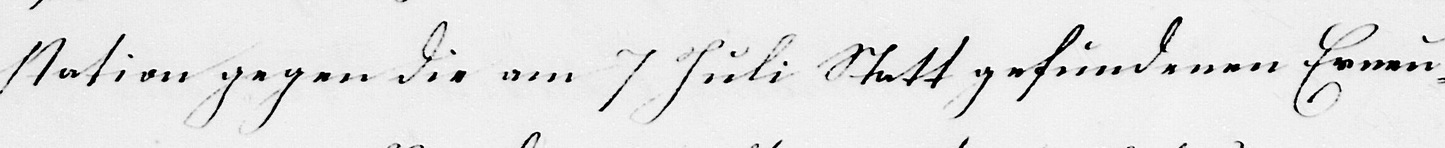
station gegen die am 7 Juli Statt gefundenen Erneu¬
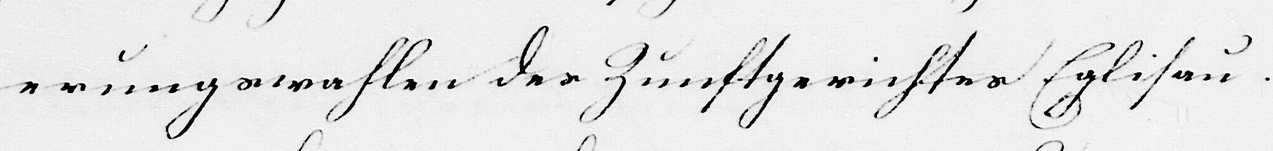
erungswahlen des Zunftgerichtes Eglisau.
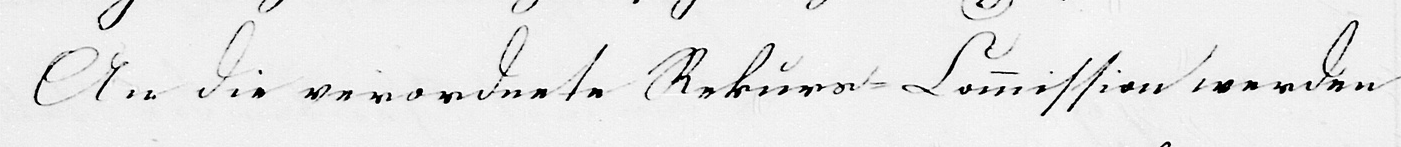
An die verordnete Rekurs-Commission werden
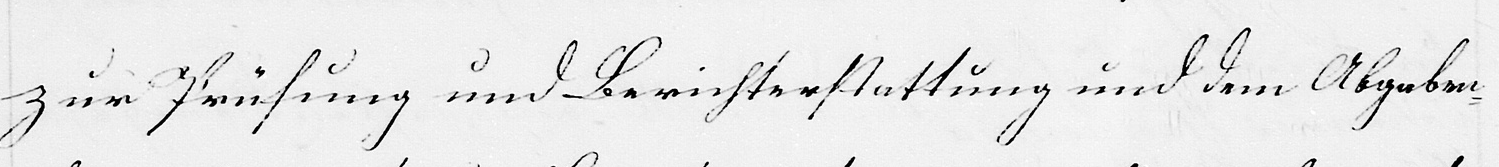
zur Prüfung und Berichterstattung und dem Abgaben¬
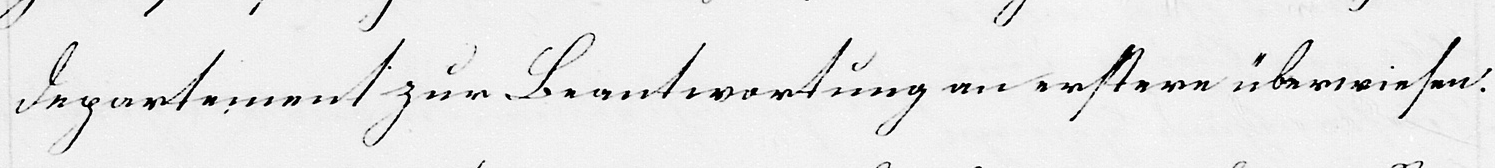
departement zur Beantwortung an erstere überwiesen.
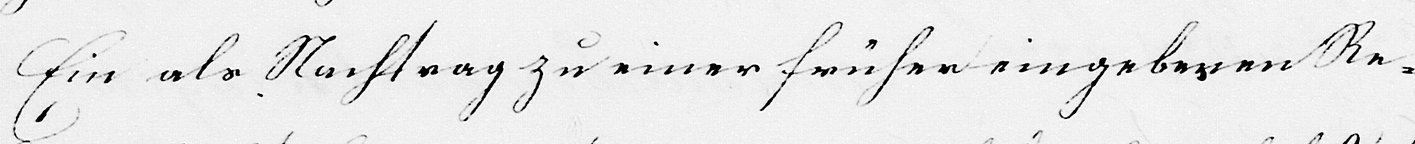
Ein als Nachtrag zu einer früher einge[ge]benen Re¬
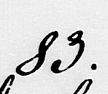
gust
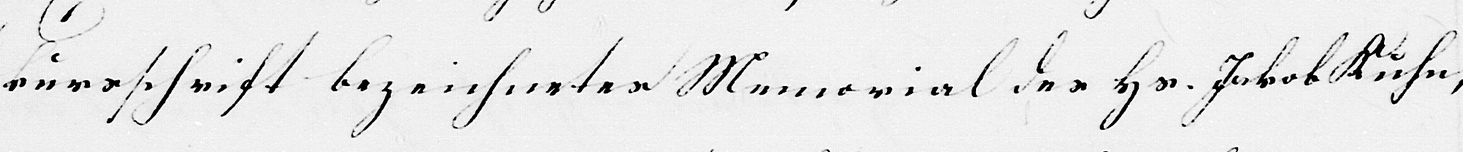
kursschrift bezeichnetes Memorial des Hs. Jakob Kuhn,
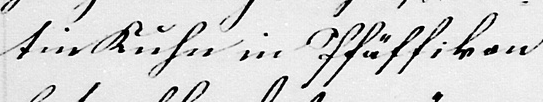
tin Kuhn in Pfäffikon
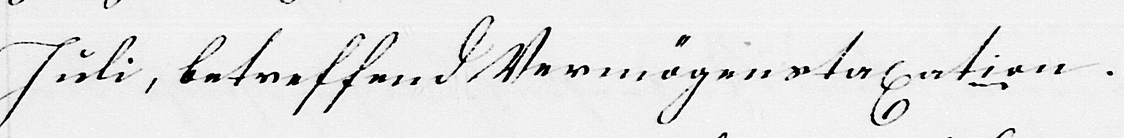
Juli, betreffend Vermögenstaxation.
